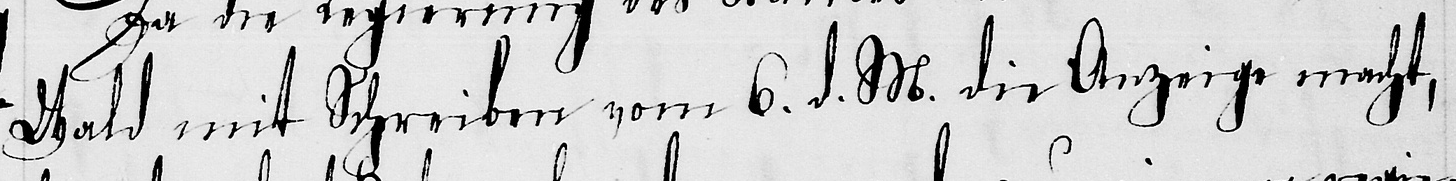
Wald mit Schreiben vom 6. d. M. die Anzeige macht,
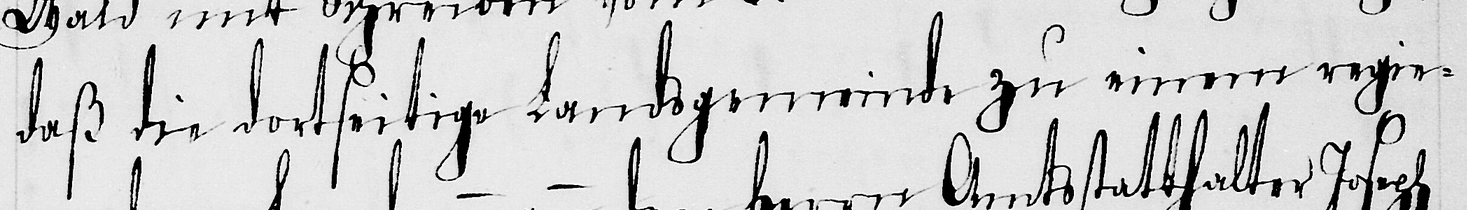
daß die dortseitige Landsgemeinde zu einem regie¬
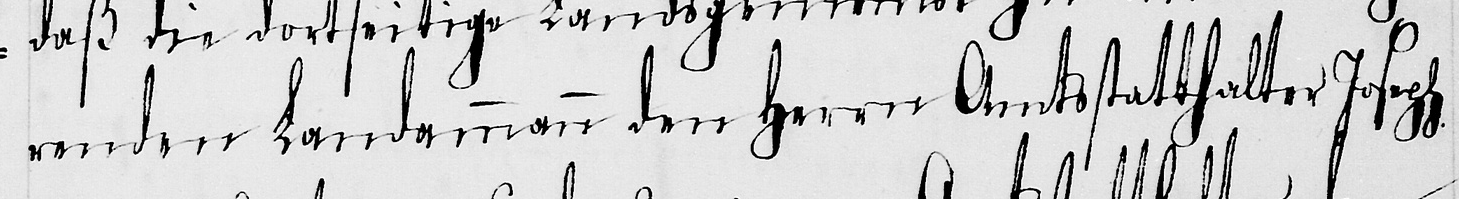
renden Landammann den Herrn Amtsstatthalter Jos¬
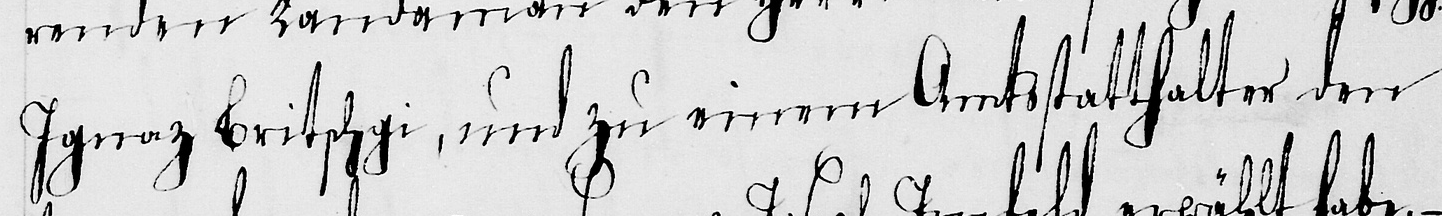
Ignaz Britschgi, und zu einem Amtsstatthalter den
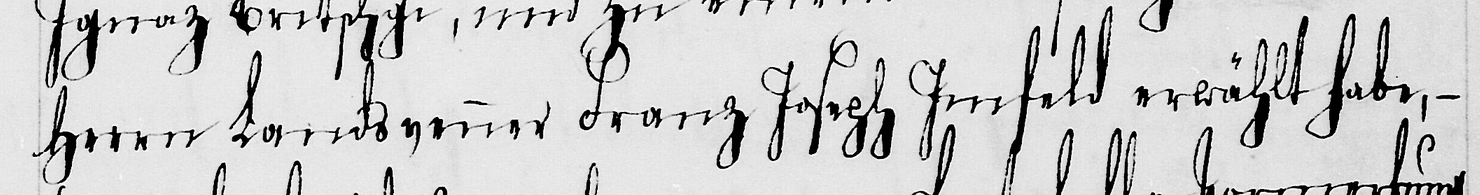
Herrn Landsvenner Franz Joseph Imfeld erwählt habe, –
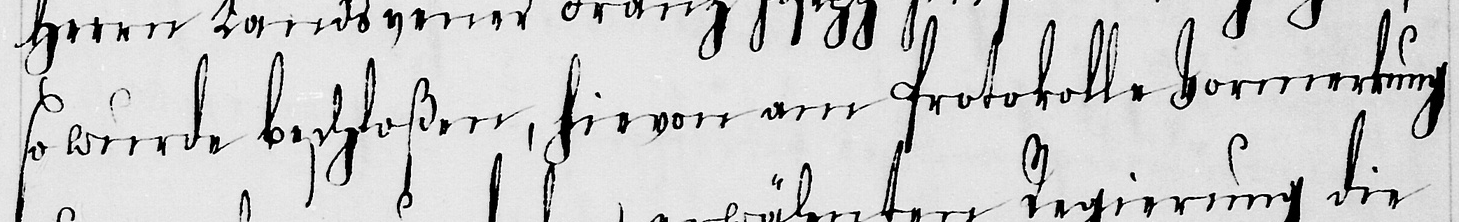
so wurde beschloßen, hievon am Protokolle Vormerkung
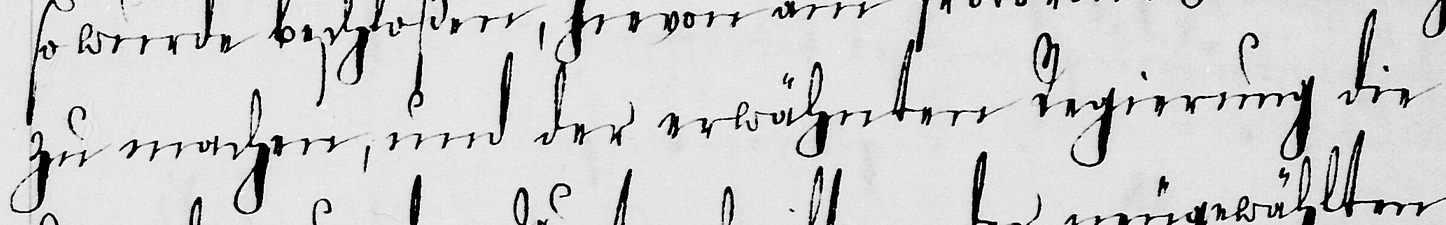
zu machen, und der erwähnten Regierung die
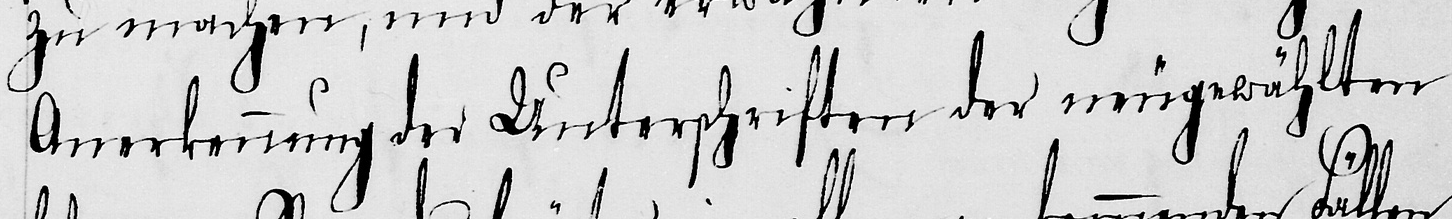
Anerkennung der Unterschriften der neugewählten
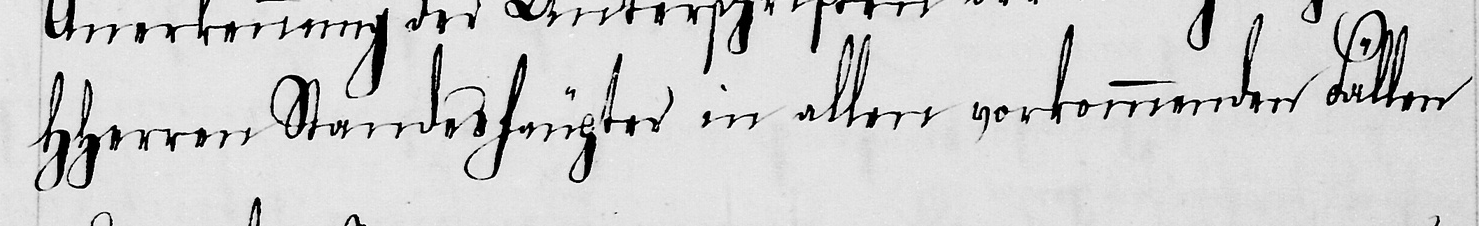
HHerren Standeshäupter in allen vorkommenden Fällen
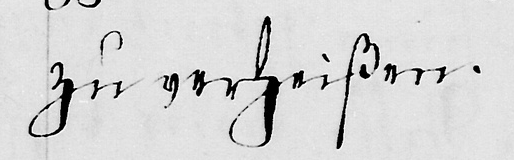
zu verheißen.
